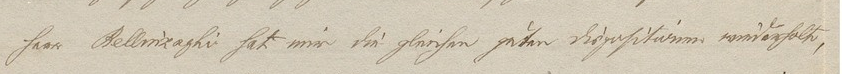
Herr Bellinzaghi hat mir die gleichen guten Dispositionen wiederholt,
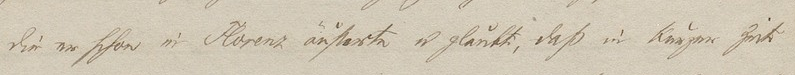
die er schon in Florenz äußerte & glaubt, daß in kurzer Zeit
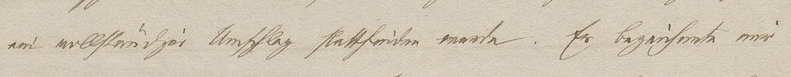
ein vollständiger Umschlag stattfinden werde. Er bezeichnete mir
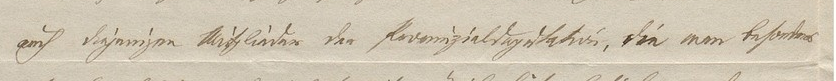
auch diejenigen Mitglieder der Provinzialdeputation, die man besonders
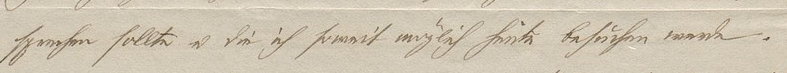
sprechen sollte & die ich soweit möglich heute besuchen werde.
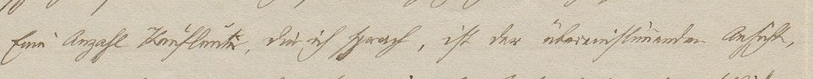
Eine Anzahl Kaufleute, die ich sprach, ist der übereinstimmenden Ansicht,
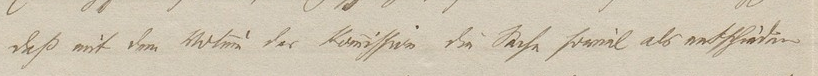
daß mit dem Votum der Kommission die Sache soviel als entschieden
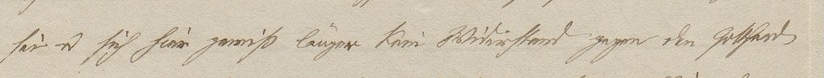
sei & sich hier gewiß länger kein Widerstand gegen den Gotthard
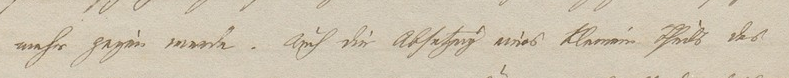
mehr zeigen werde. Auch die Absetzung eines kleinen Theils des
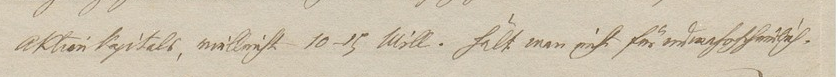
Aktienkapitals, vielleicht 10–15 Mill. hält man nicht für unwahrscheinlich.
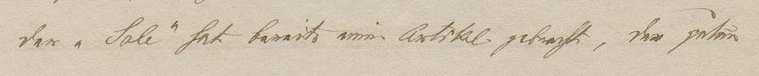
Der «Sole» hat bereits einen Arikel gebracht, der guten
